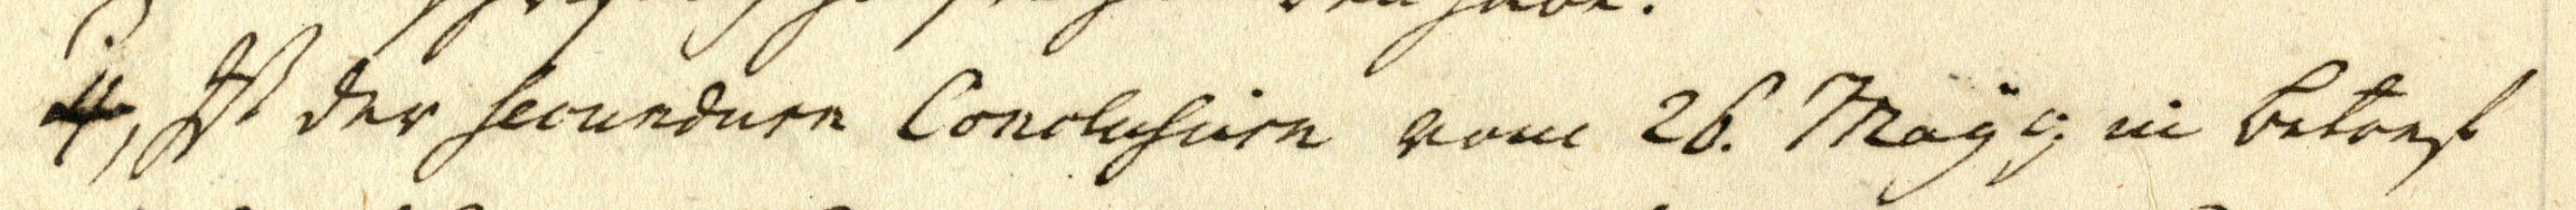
4, Ist der secundum Conclusum vom 26. Maÿ c. in Betref
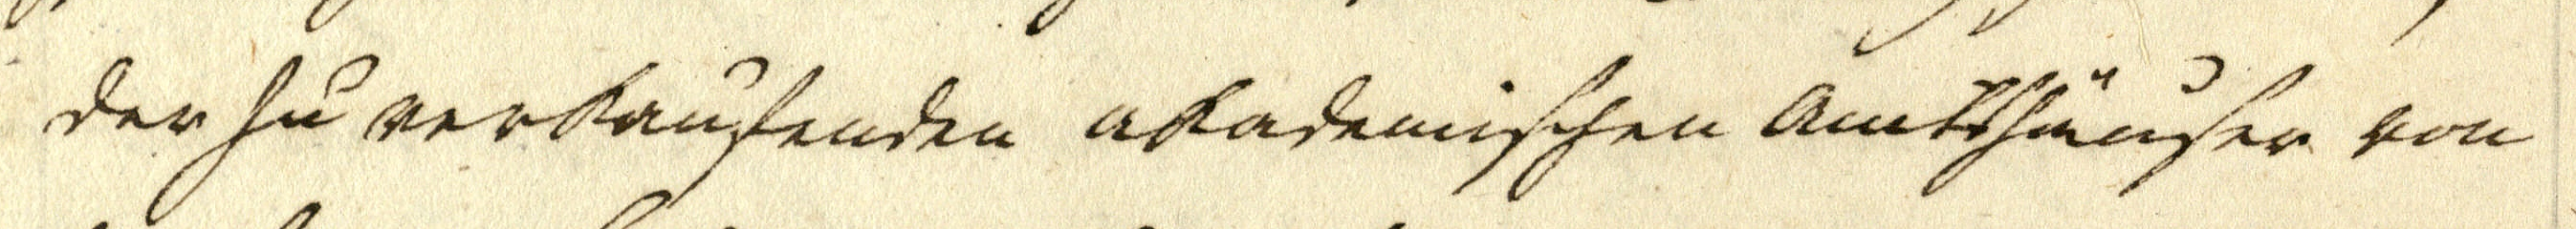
der zu verkaufenden akademischen Amtshäuser von
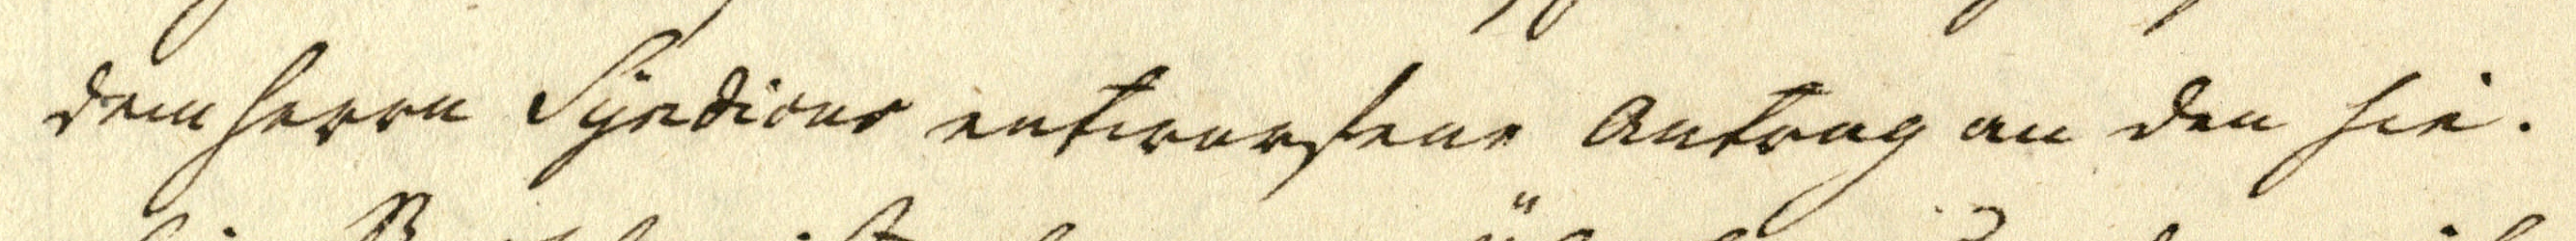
dem herrn Sÿndicus entworfene Antrag an den hie¬
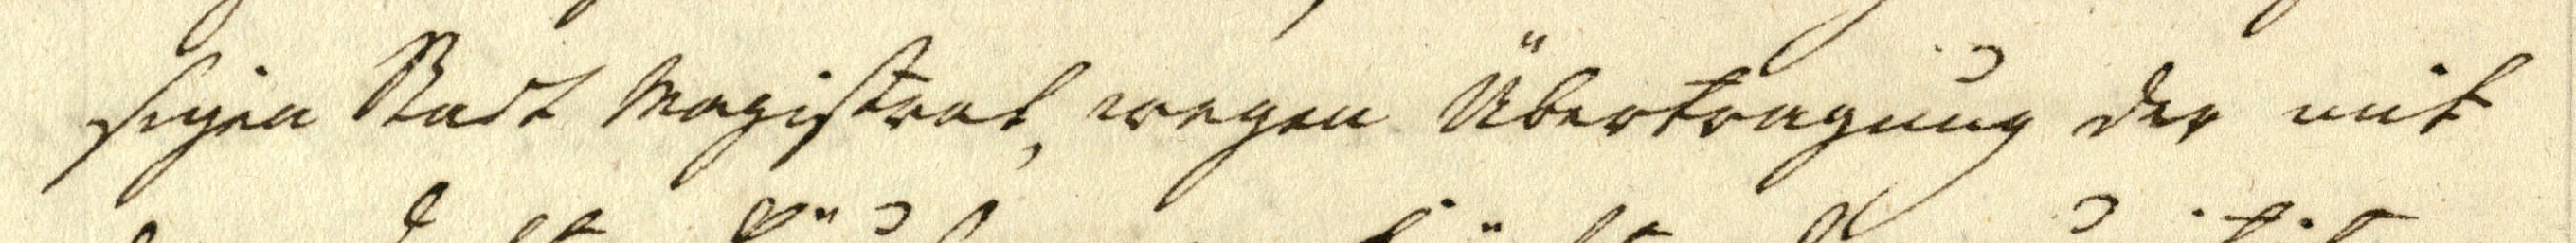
sigen Stadt Magistrat, wegen Übertragung der mit
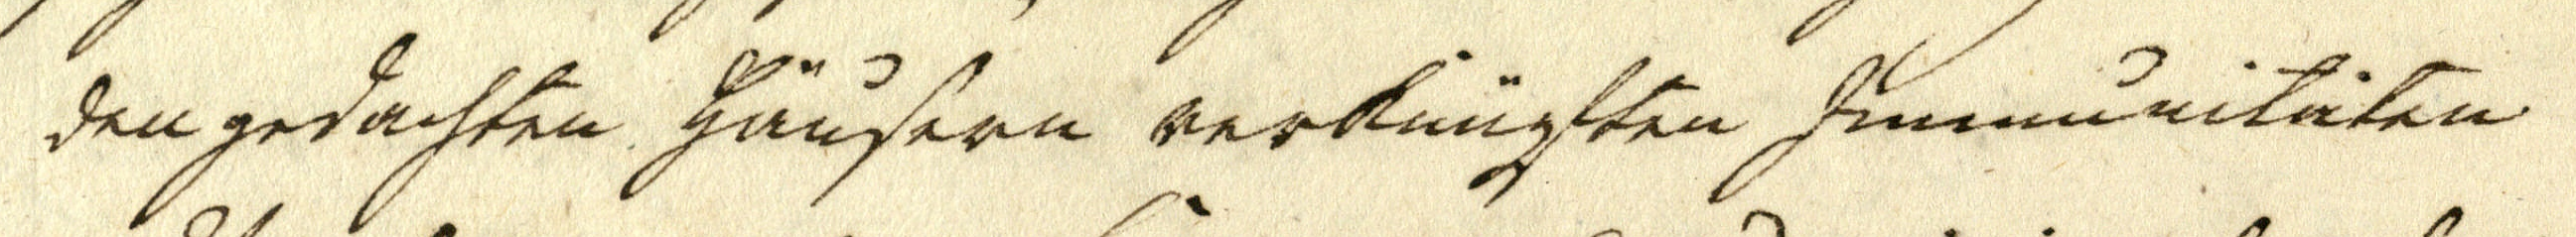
den gedachten Häusern verknüpften Immunitäten
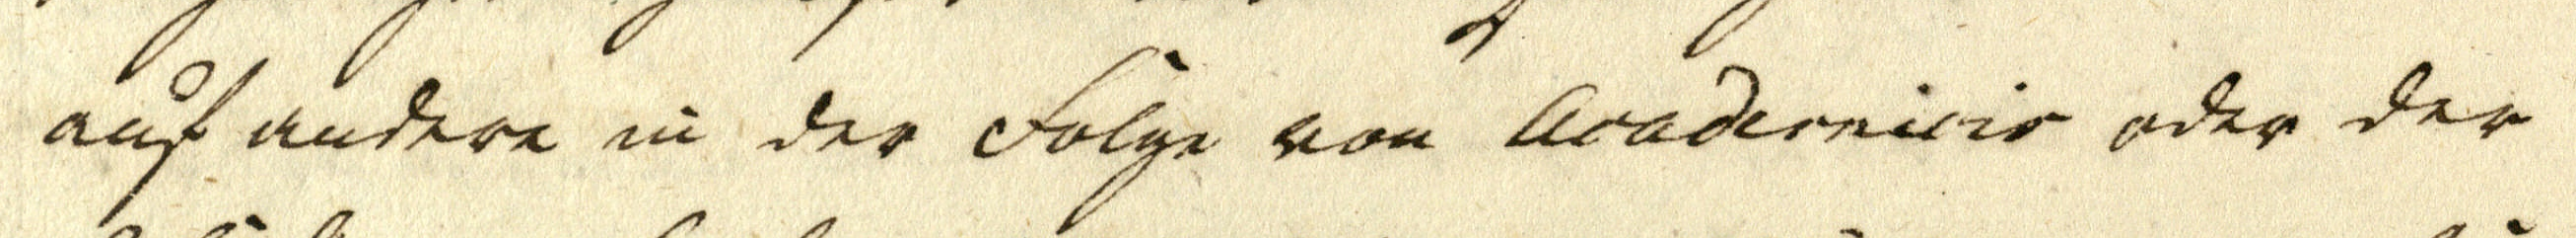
auf andere in der Folge von Academicis oder der
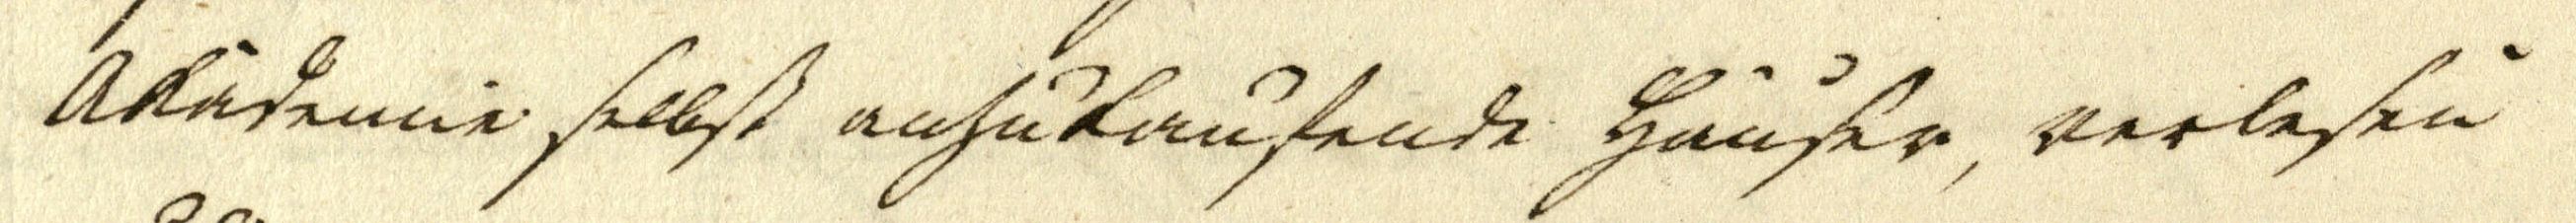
Akademie selbst anzukaufende Häuser, verlesen
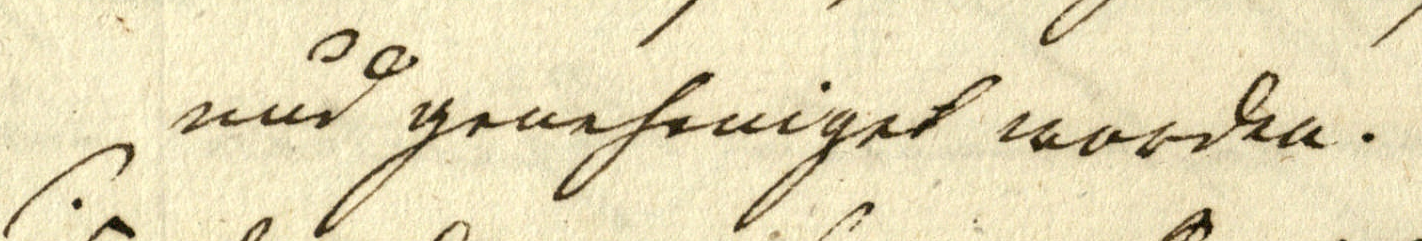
und genehmiget worden.
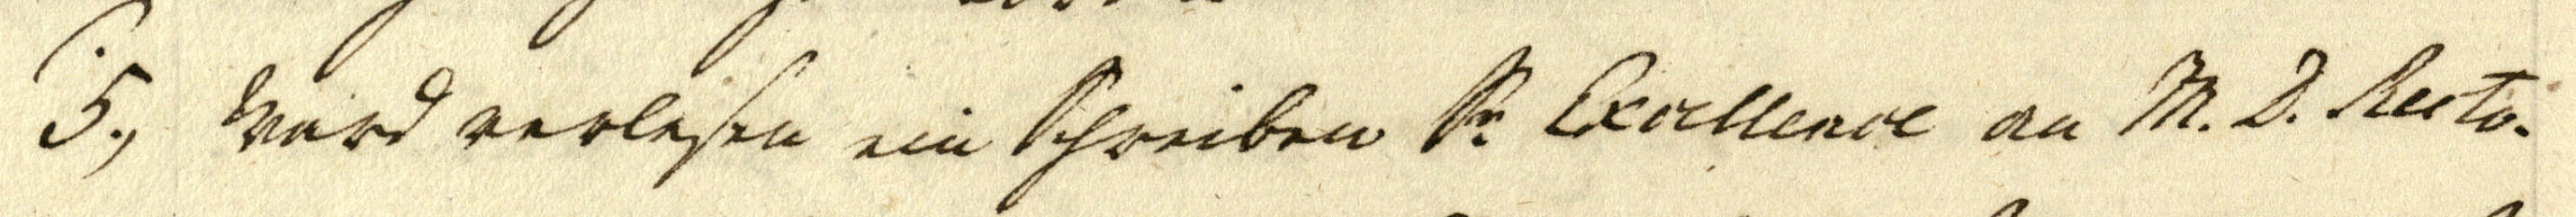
5., Wird verlesen ein Schreiben Sr. Excellence an M. D. Recto¬
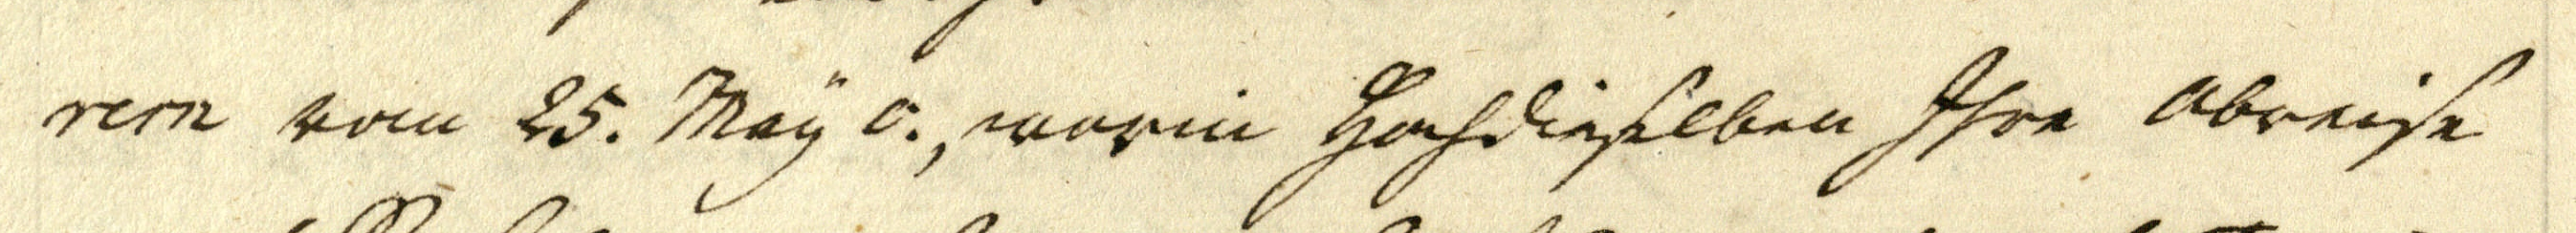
rem vom 25. Maÿ c., worin Hochdieselben Ihre Abreise
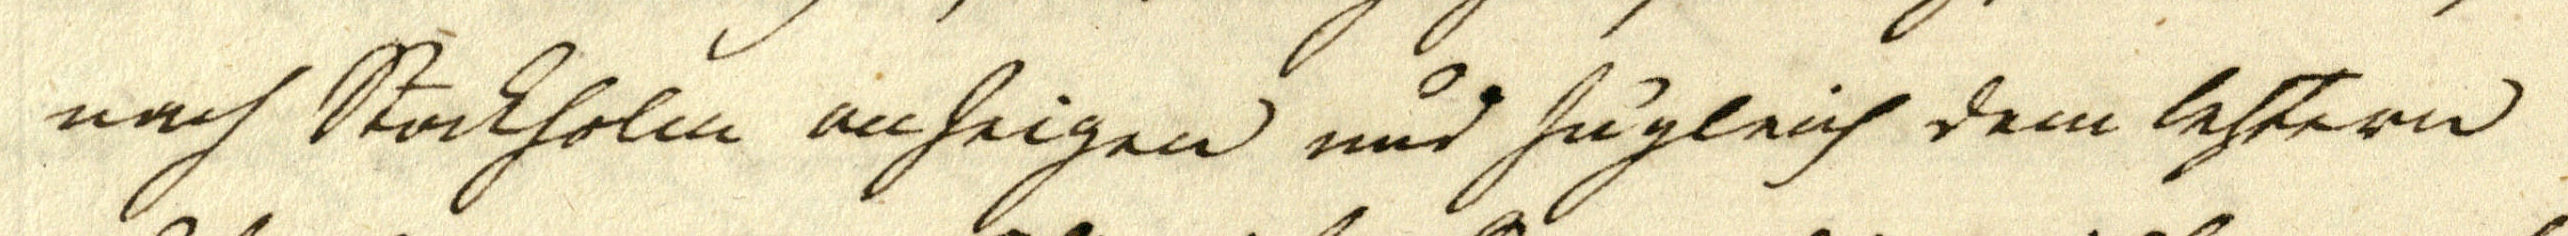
nach Stockholm anzeigen und zugleich dem letztern
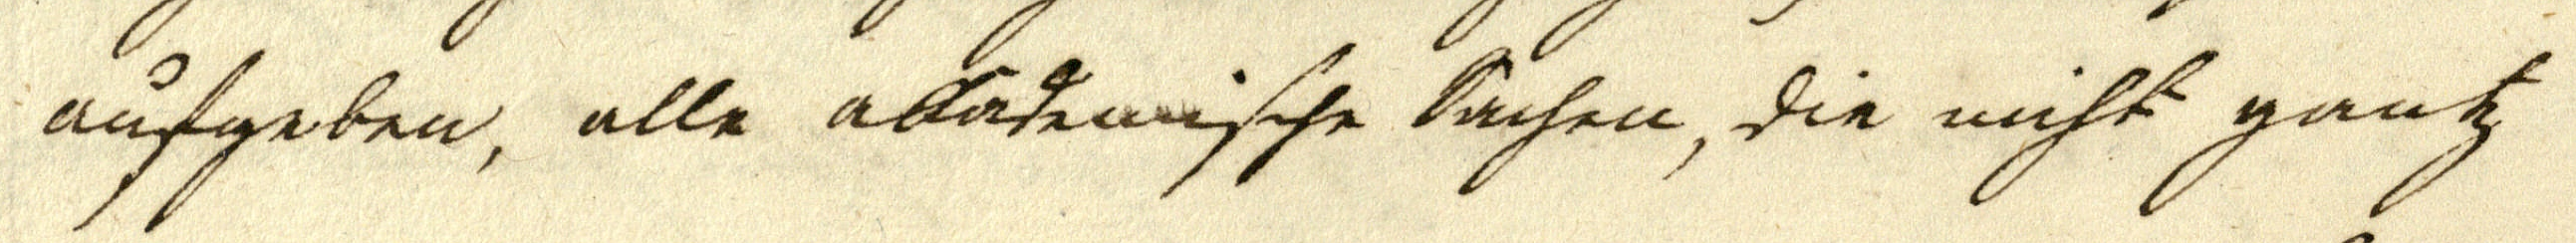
aufgeben, alle akademische Sachen, die nicht gantz
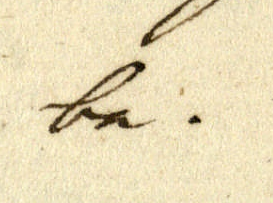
be
